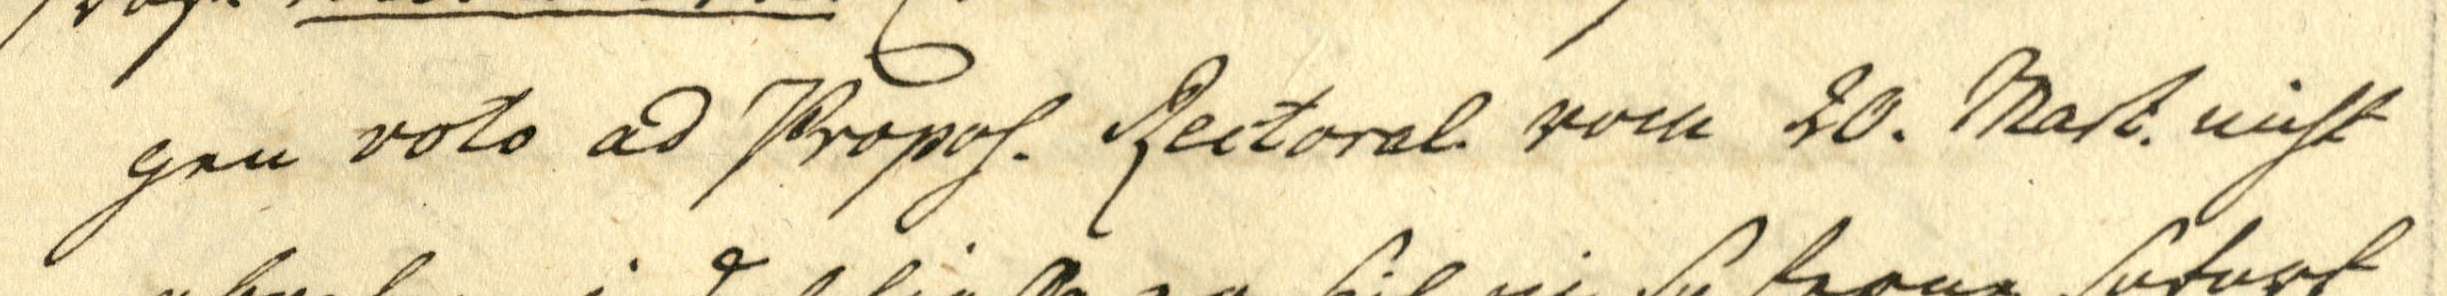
gen voto ad Propos. Rectoral. vom 20. Mart. nicht
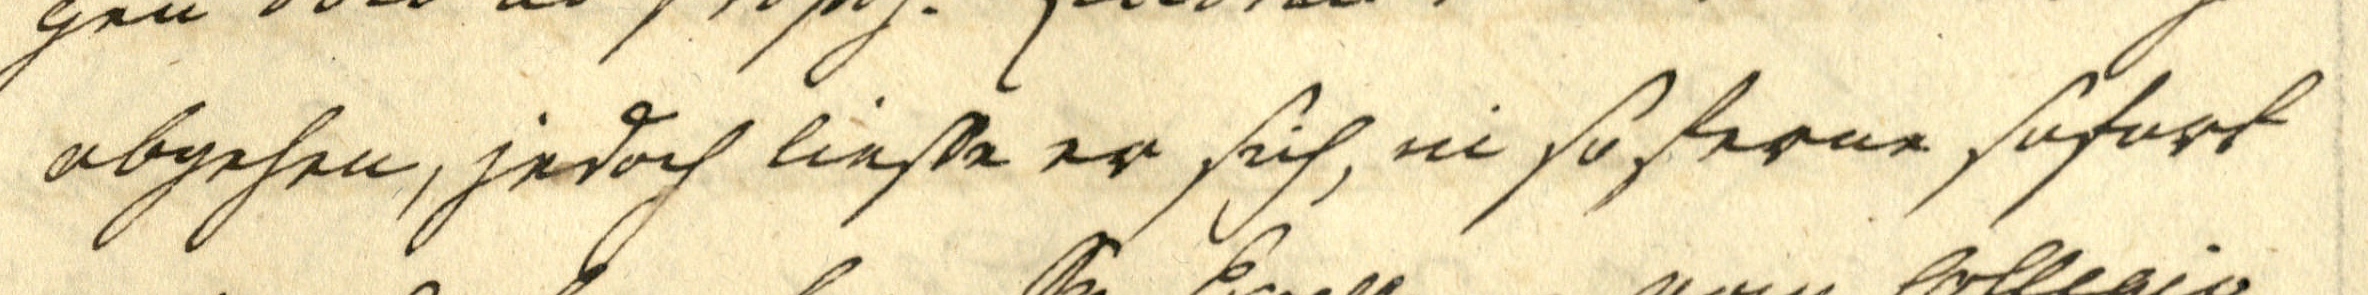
abgehen, jedoch liesse er sich, in so ferne sofort
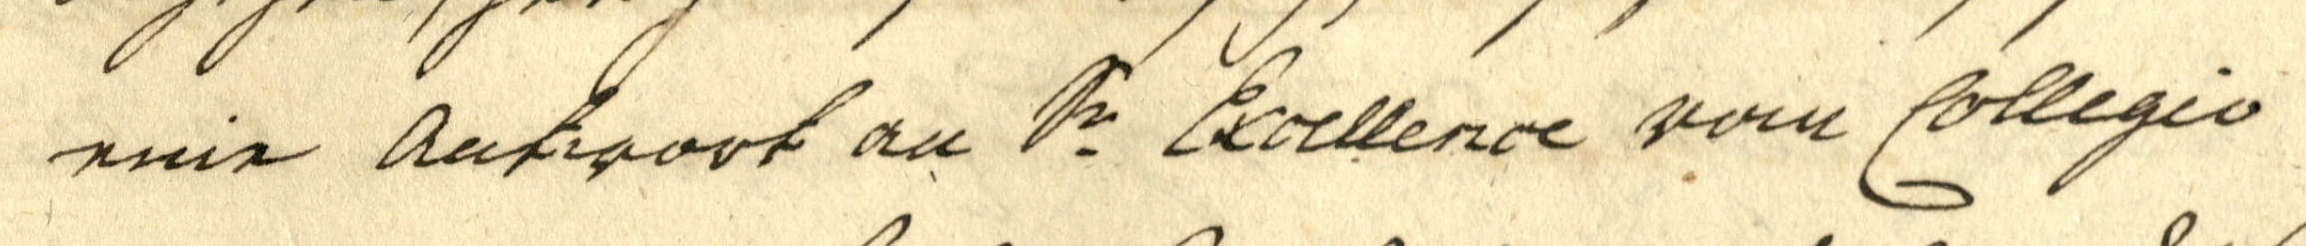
eine Antwort an Sr. Excellence vom Collegio
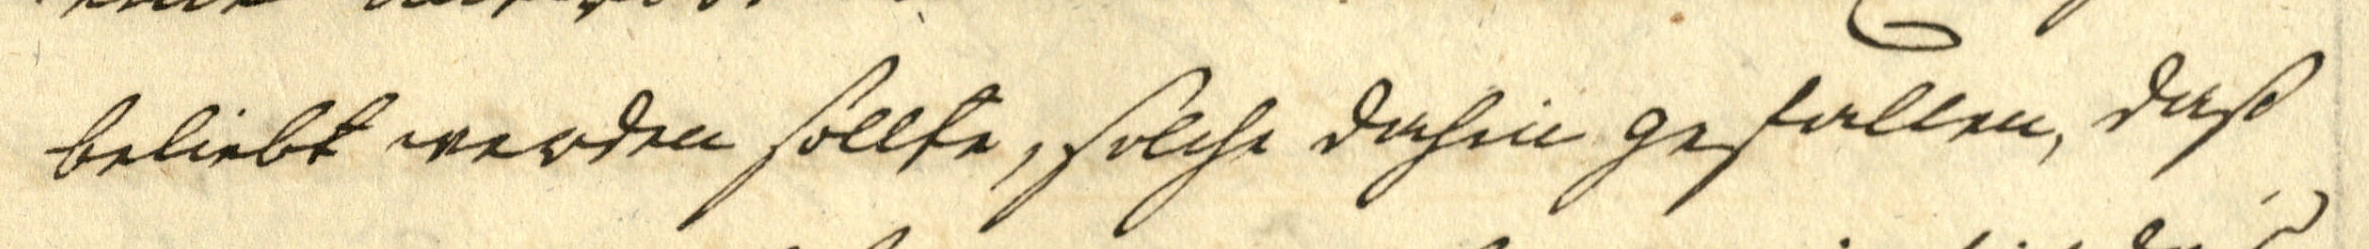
beliebt werden sollte, solche dahin gefallen, daß
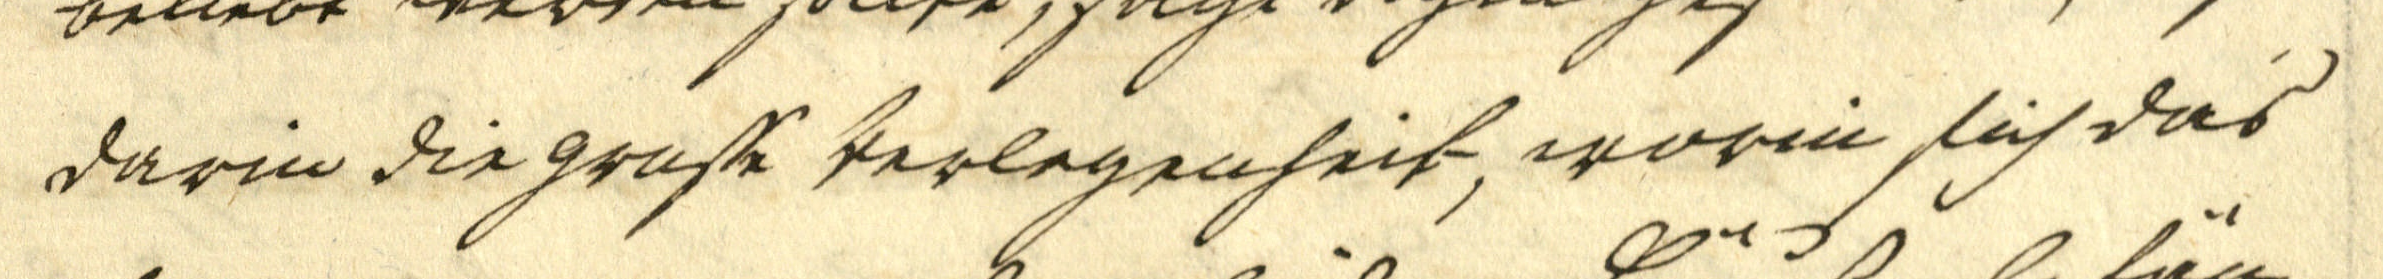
darin die grosse Verlegenheit, worin sich das
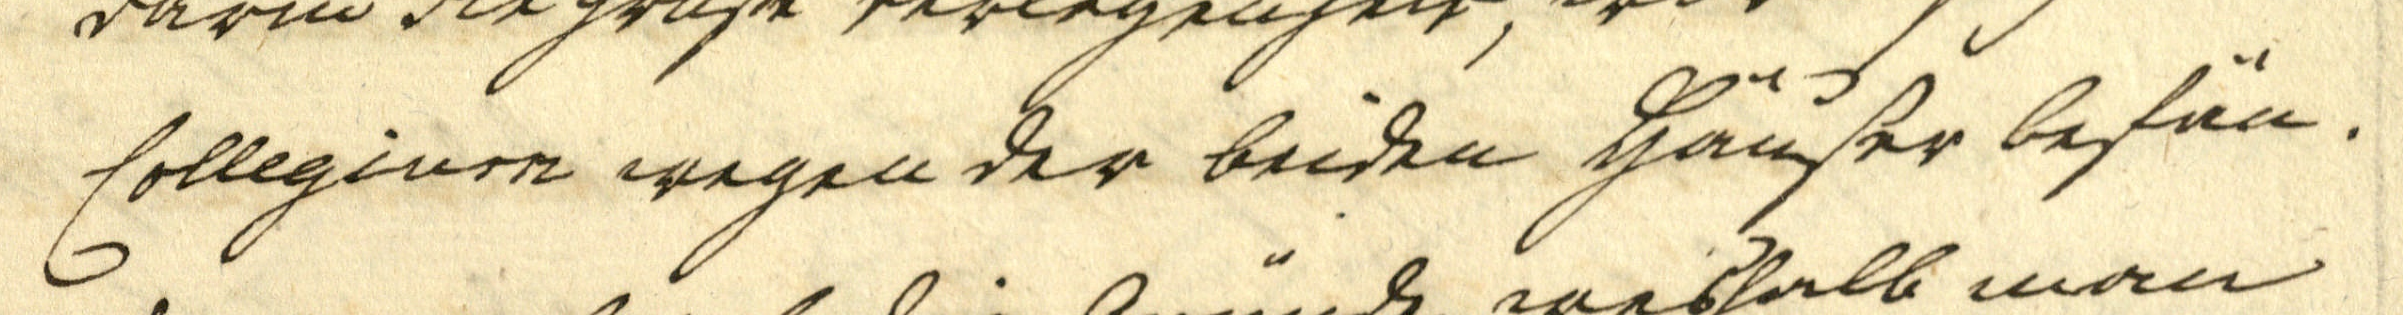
Collegium wegen der beiden Häuser befän¬
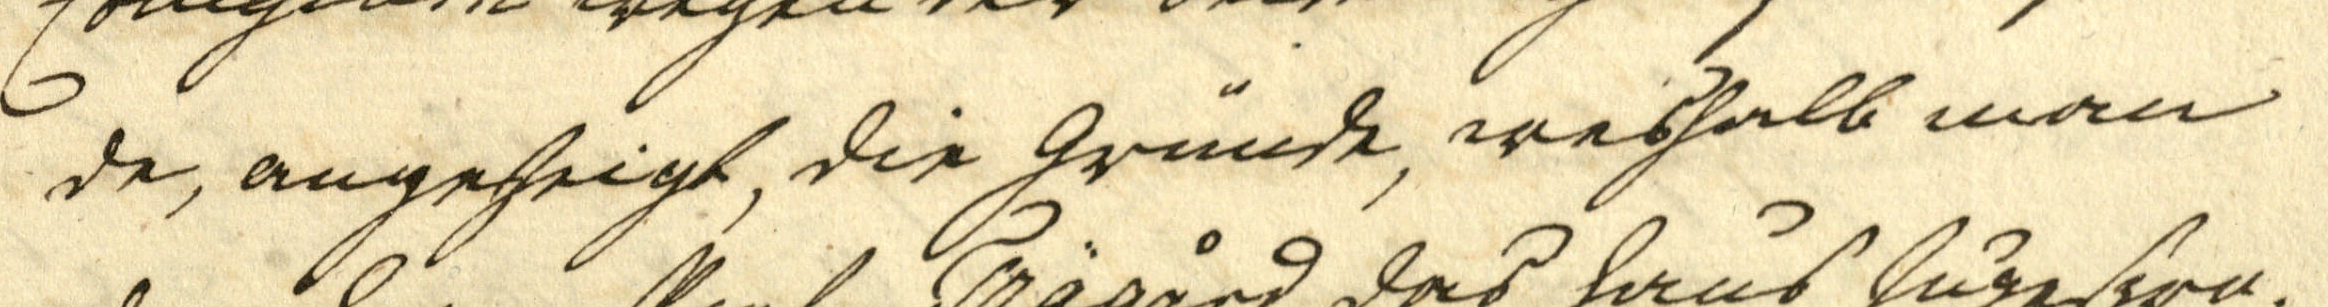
de, angezeigt, die Gründe, weshalb man
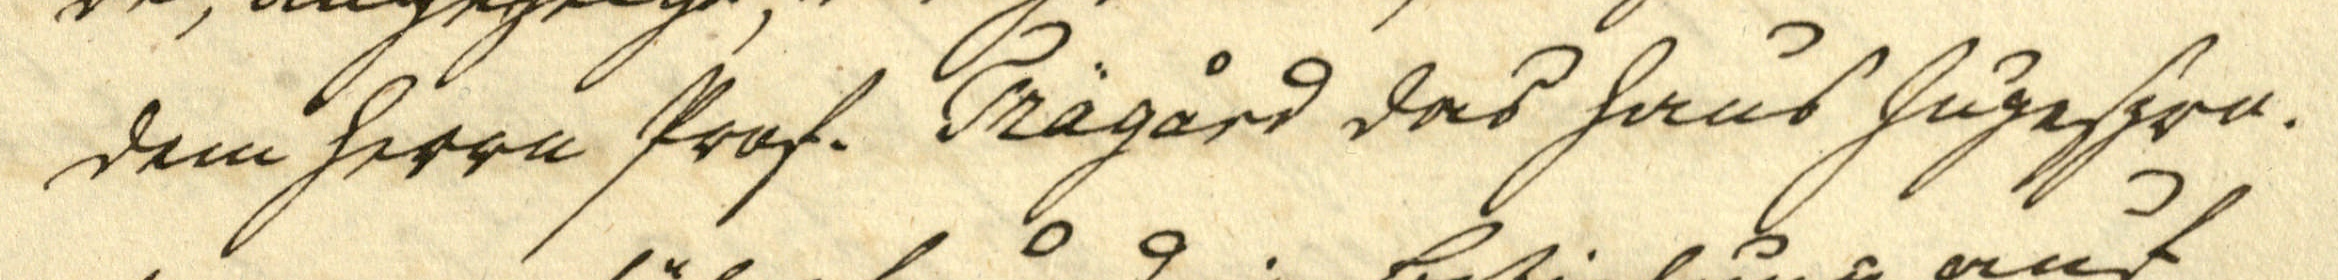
dem Herrn Prof. Trägård das Haus zugespro¬
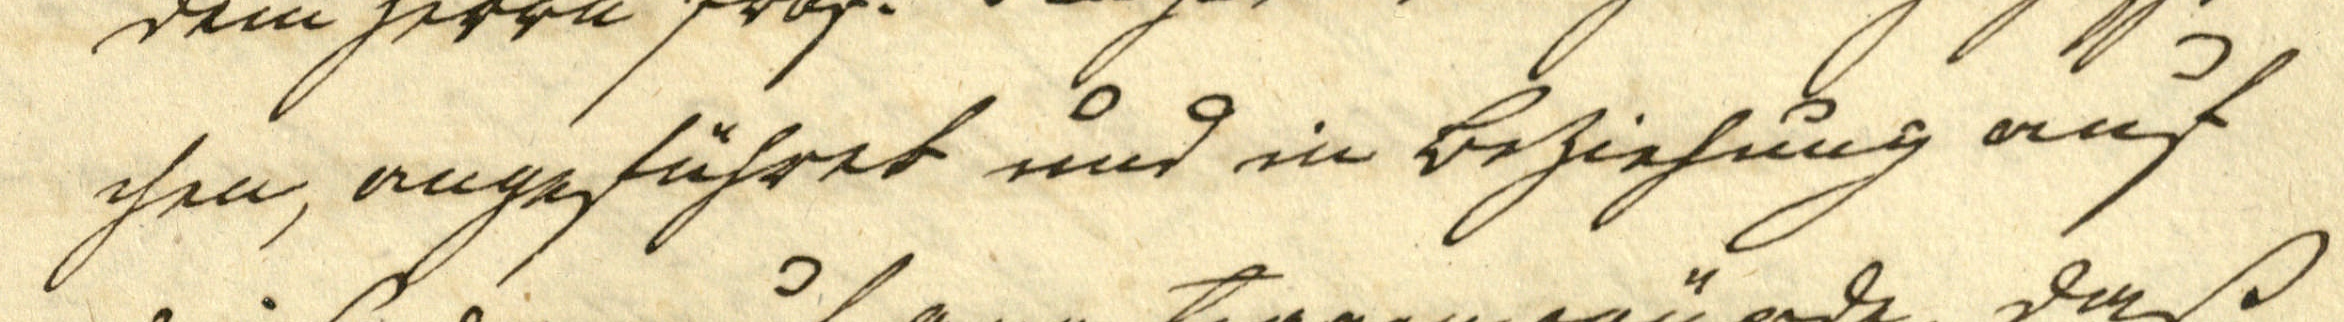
chen, angeführet und in Beziehung auf
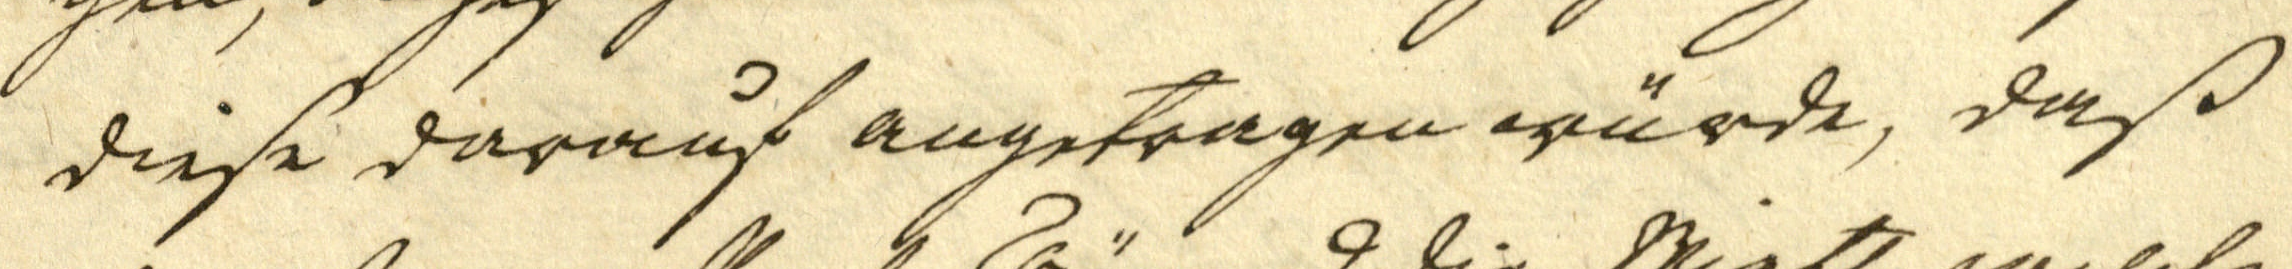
diese darauf angetragen würde, daß
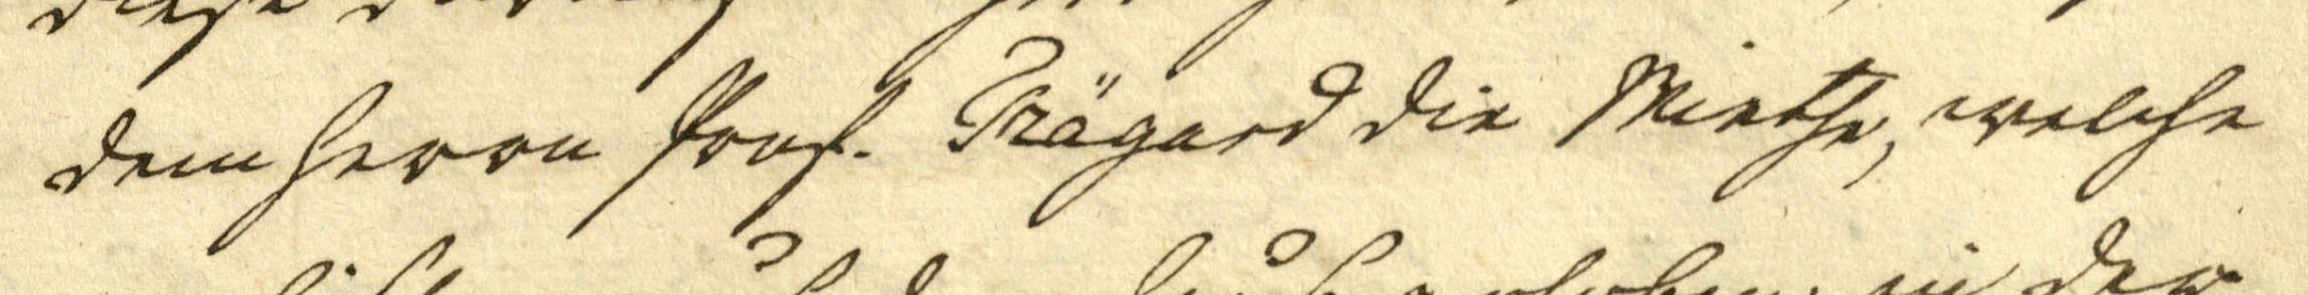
dem Herrn Prof. Trägård die Miethe, welche
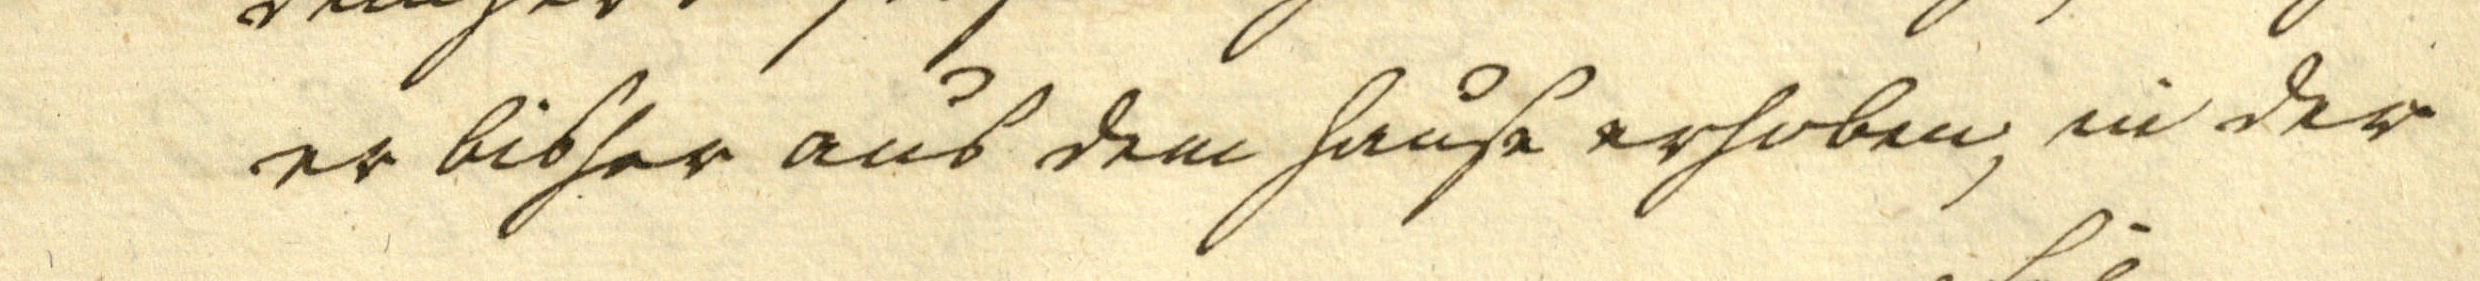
er bisher aus dem Hause erhoben, in der
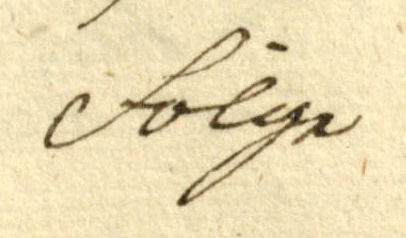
Folge
